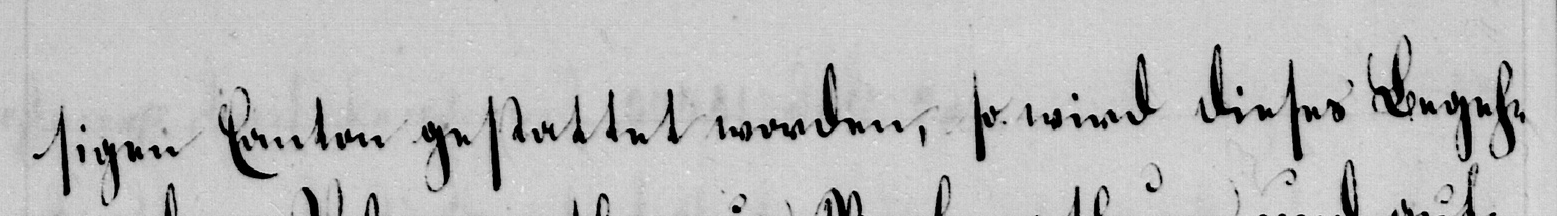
sigen Canton gestattet werden, so wird dieses Begeh¬
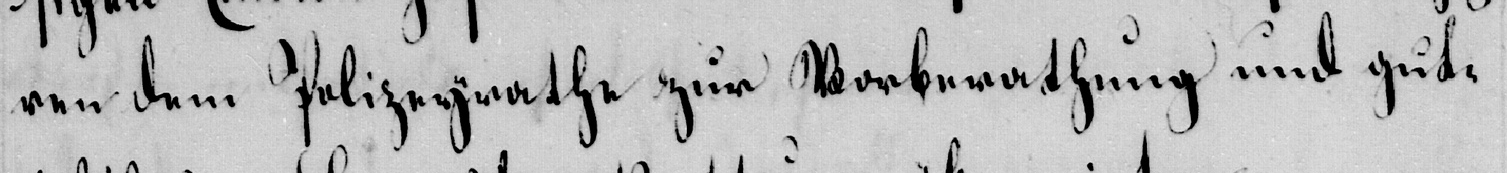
ren dem Polizeyrath zur Vorberathung und gut¬
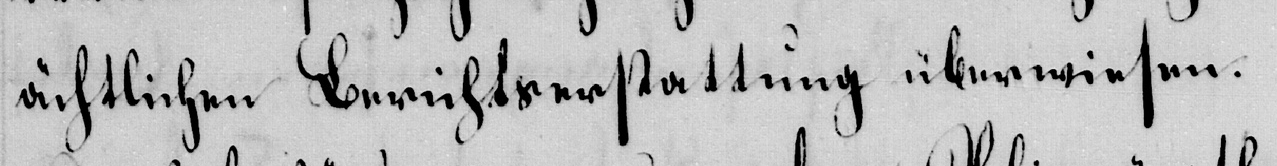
ächtlichen Berichtserstattung überwiesen.
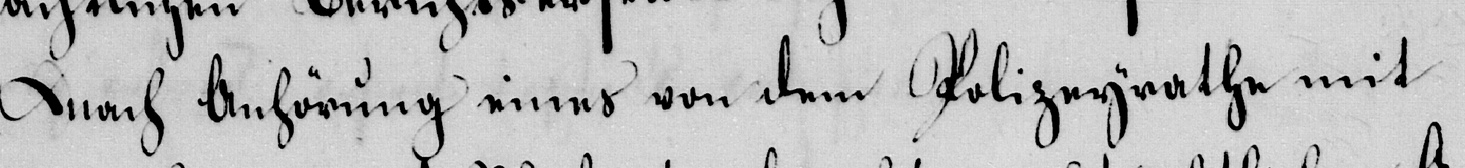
Nach Anhörung eines von dem Polizeyrathe mit
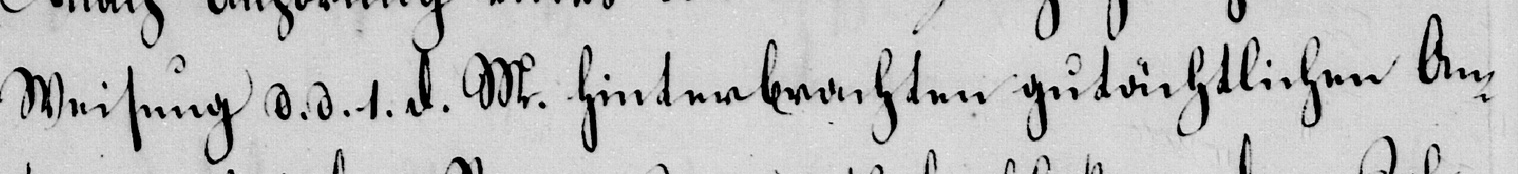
Weisung d. d. 1. d. M. hinterbrachten gutächtlichen An¬
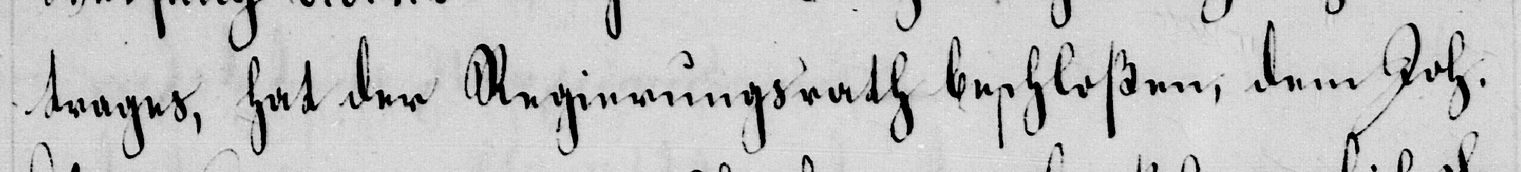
trages, hat der Regierungsrath beschloßen, dem Joh.
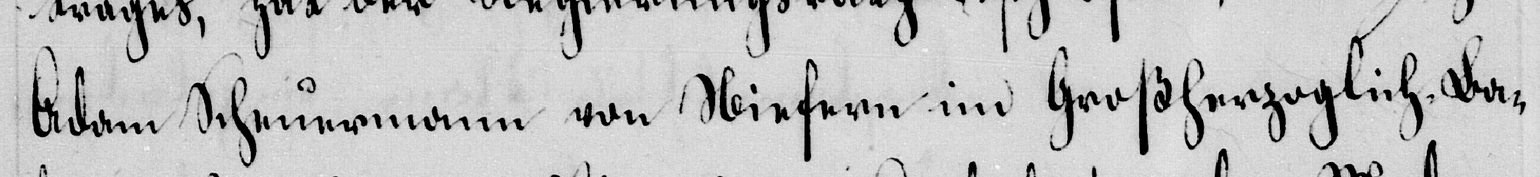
Adam Scheuermann von Niesern im Großherzoglich-Ba¬
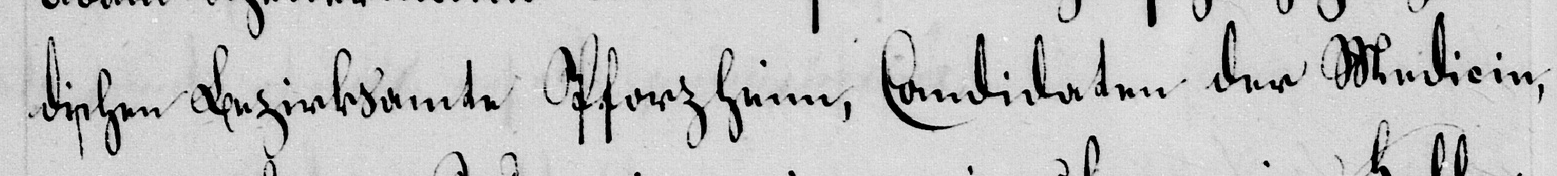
dischen Bezirksamtes Pforzheim, Candidaten der Medicin,
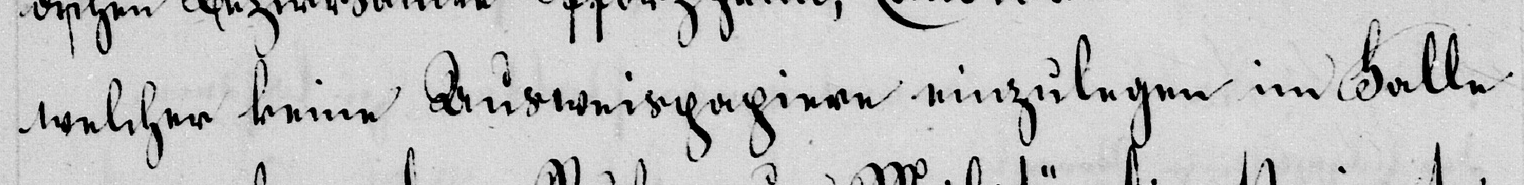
welcher keine Ausweispapiere einzulegen im Falle
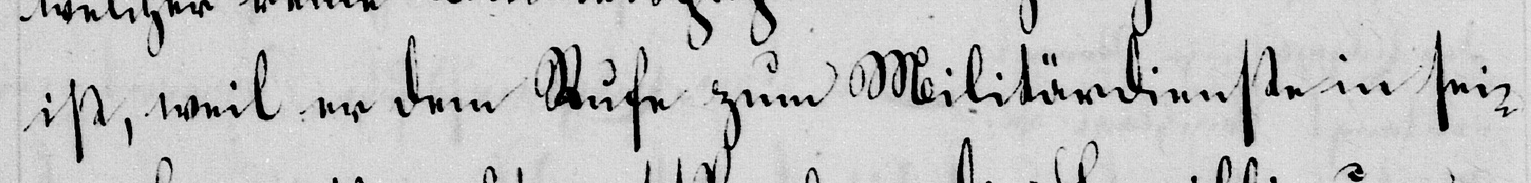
ist, weil er dem Rufe zum Militärdienste in sei¬
